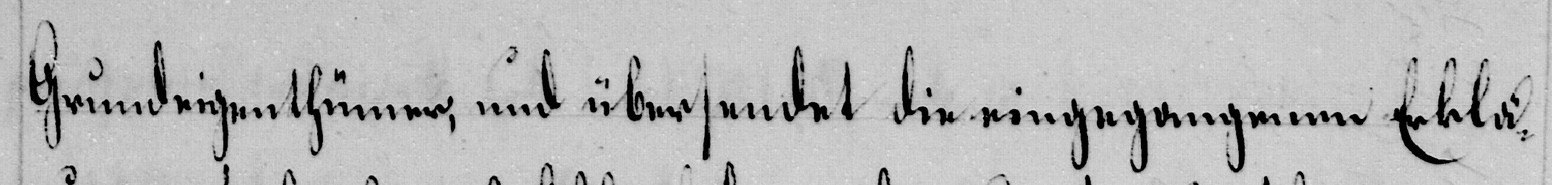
Grundeigenthümer, und übersendet die eingegangenen Erklä¬
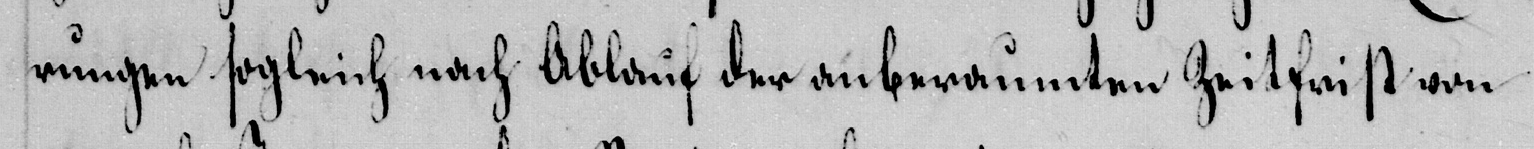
rungen sogleich nach Ablauf der anberaumten Zeitfrist von
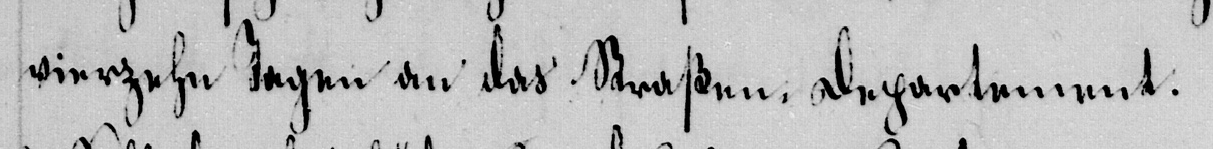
vierzehn Tagen an das Straßen-Departement.
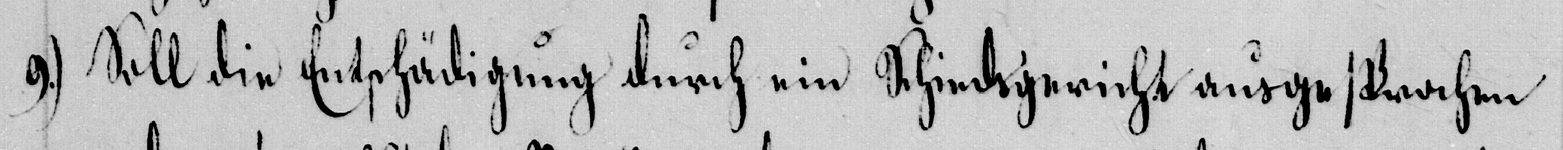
9.) Soll die Entschädigung durch ein Schiedsgericht ausgesprochen
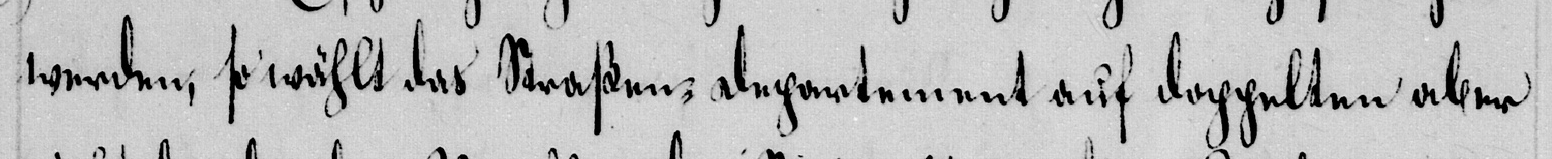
werden, so wählt das Straßen-Departement auf doppelten aber
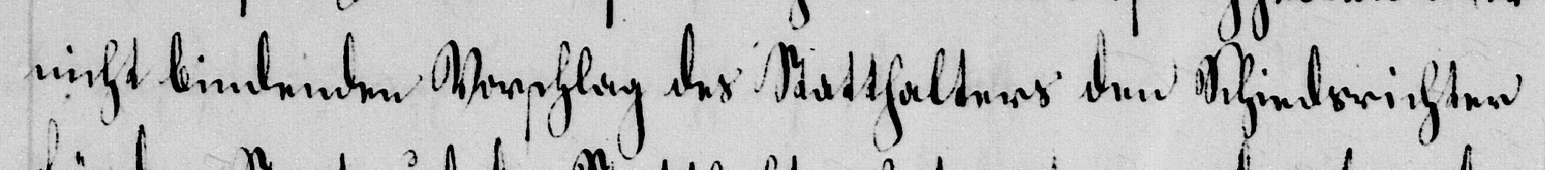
nicht bindenden Vorschlag des Statthalters den Schiedsrichter
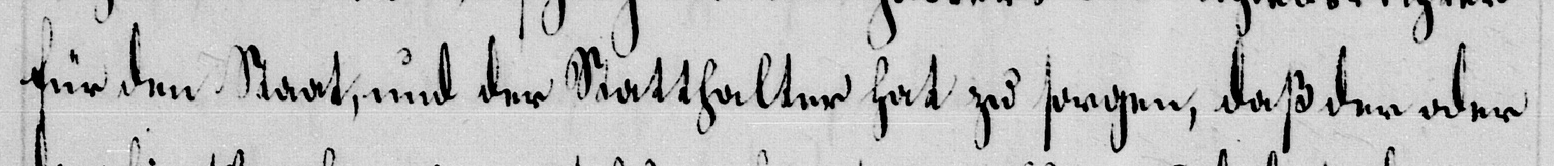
für den Staat, und der Statthalter hat zu sorgen, daß der oder
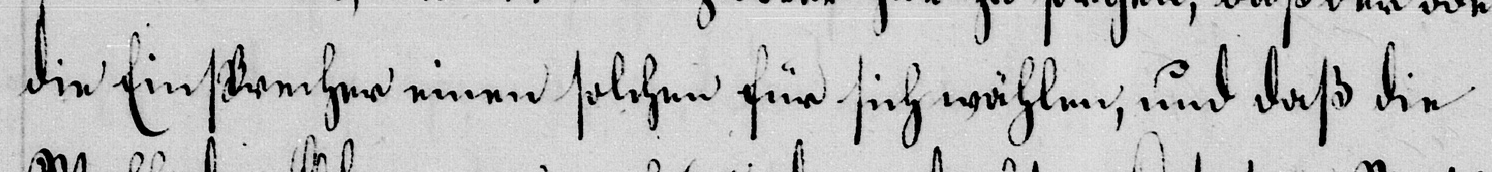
die Einsprecher einen solchen für sich wählen, und daß die
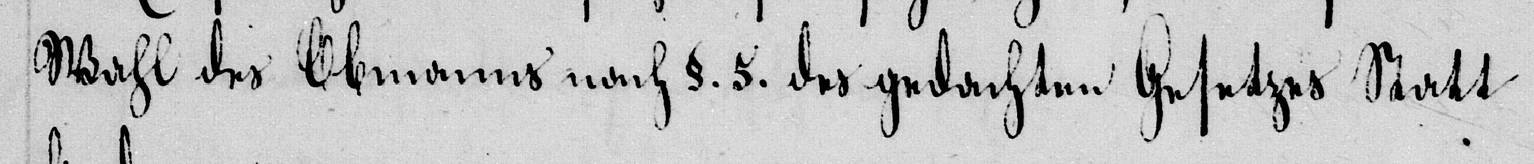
Wahl des Obmanns nach §. 5. des gedachten Gesetzes Statt
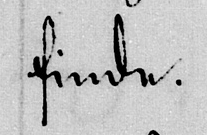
finde.
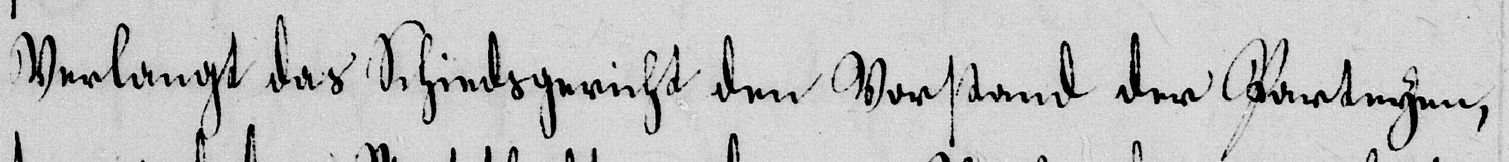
Verlangt das Schiedsgericht den Vorstand der Parteyen,
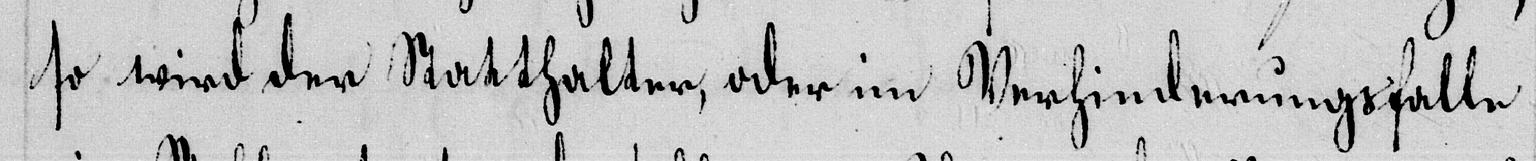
so wird der Statthalter, oder im Verhinderungsfalle
